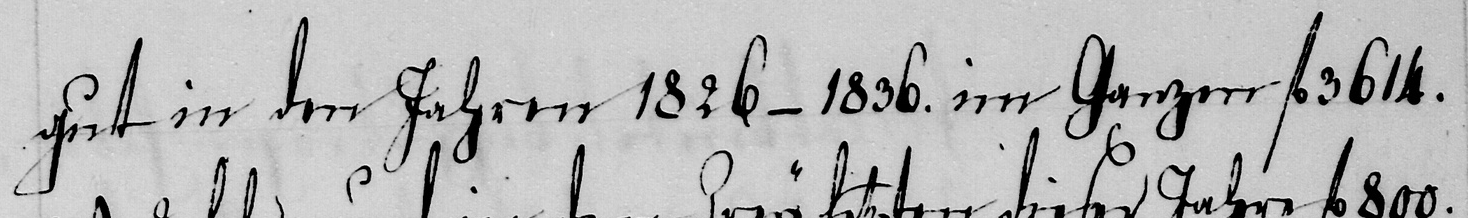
gut in den Jahren 1826 – 1836. im Ganzen fl. 3614.
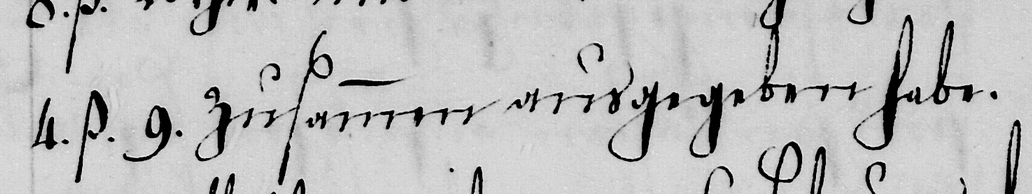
4. ß. 9. zusammen ausgegeben habe.
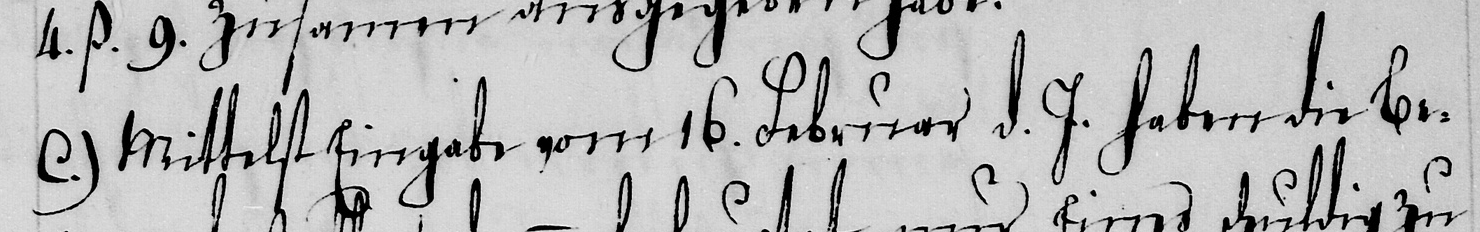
C.) Mittelst Eingabe vom 16. Februar d. J. haben die Be¬
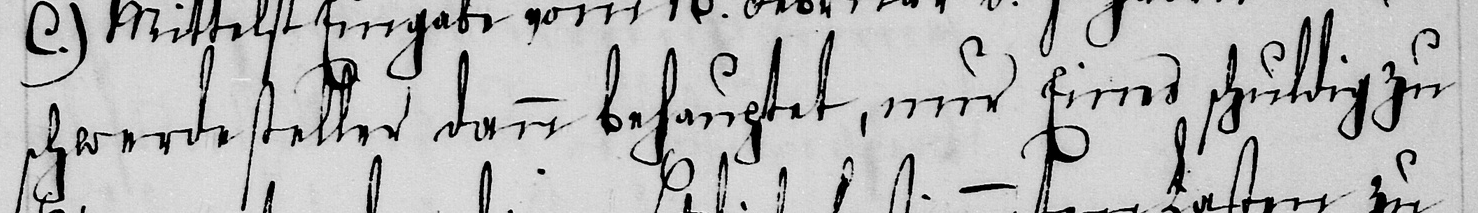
schwerdesteller dann behauptet, nur Eines schuldig zu
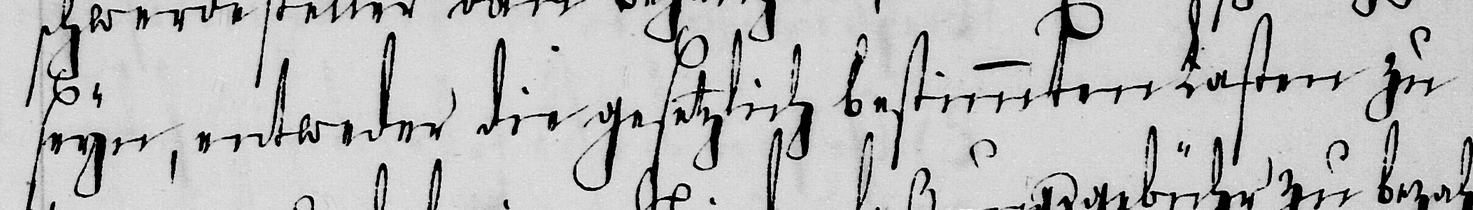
seyn, entweder die gesetzlich bestimmten Lasten zu
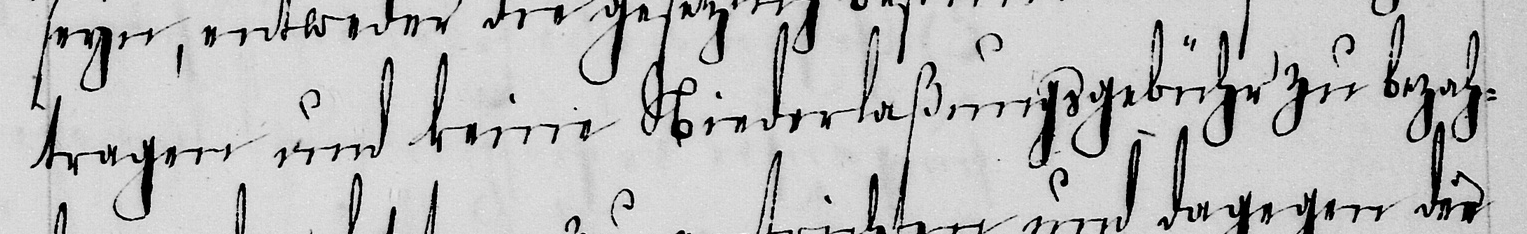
tragen und keine Niederlaßungsgebühr zu bezah¬
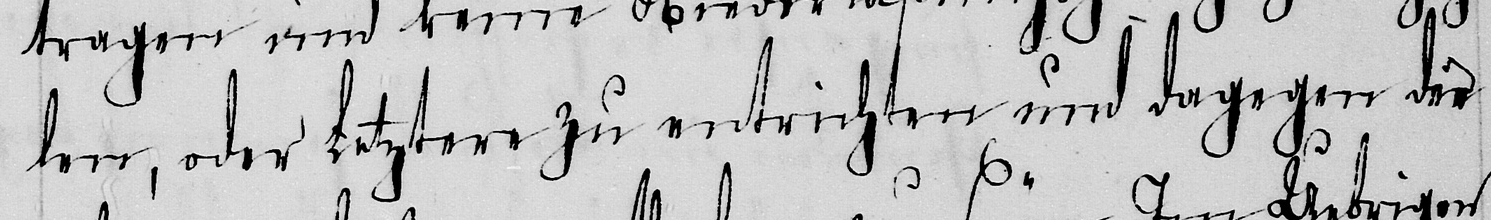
len, oder Letztere zu entrichten und dagegen des
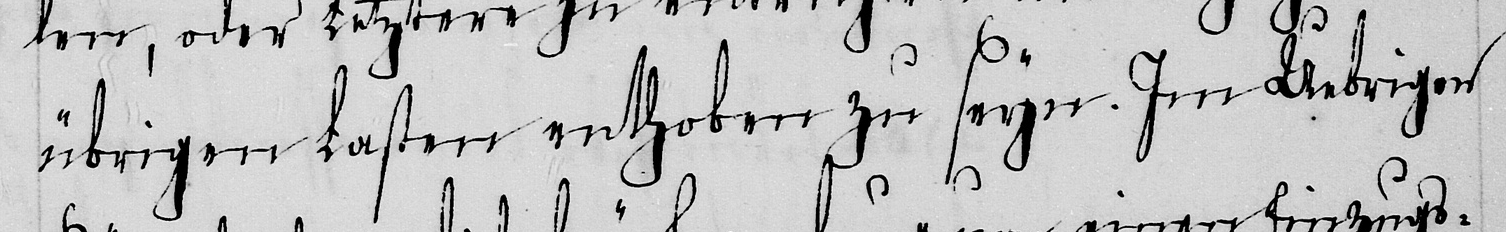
übrigen Lasten enthoben zu seyn. Im Uebrigen
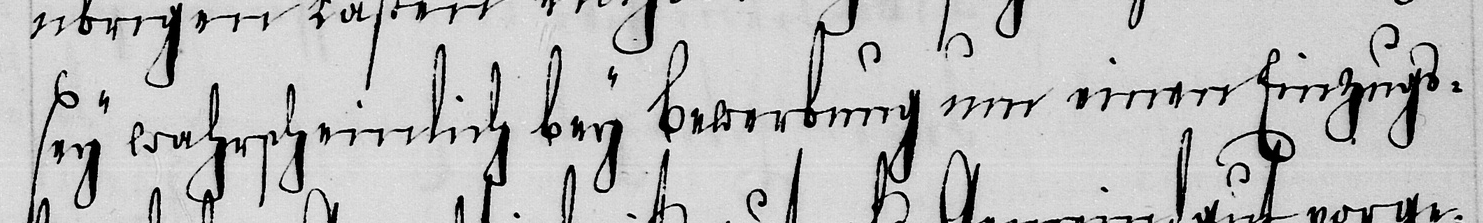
sey wahrscheinlich bey Bewerbung um einen Einzugs¬
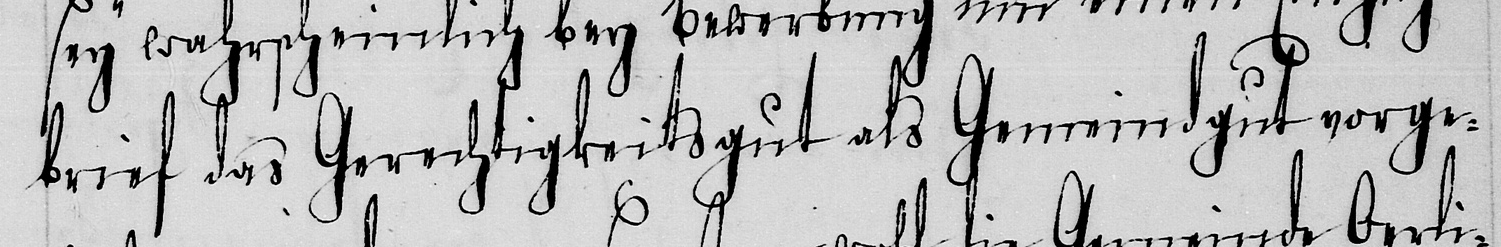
brief das Gerechtigkeitsgut als Gemeindgut vorge¬
